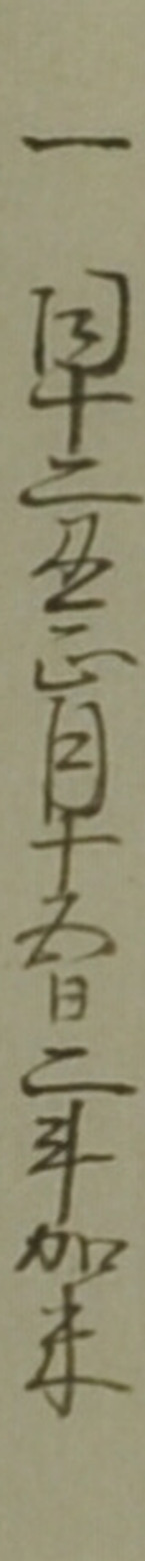一同十二丑正月十五日二斗加米
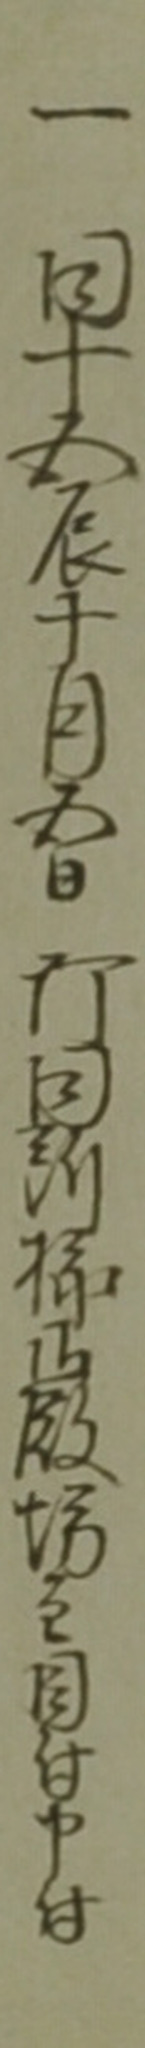一同十五辰十月五日御同所様御殿坊主目付申付
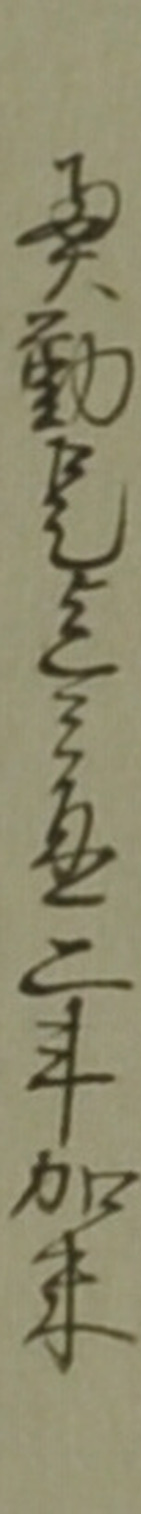奥勤是迄之通ニ斗加米
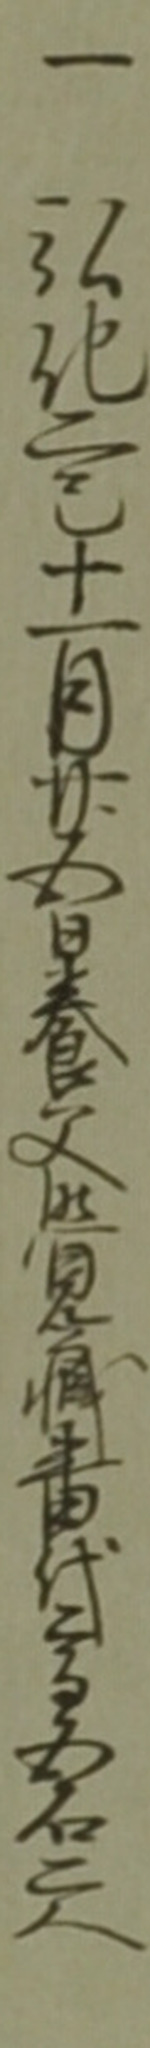一弘化二巳十一月廿五日養父覚蔵番代高五石二人
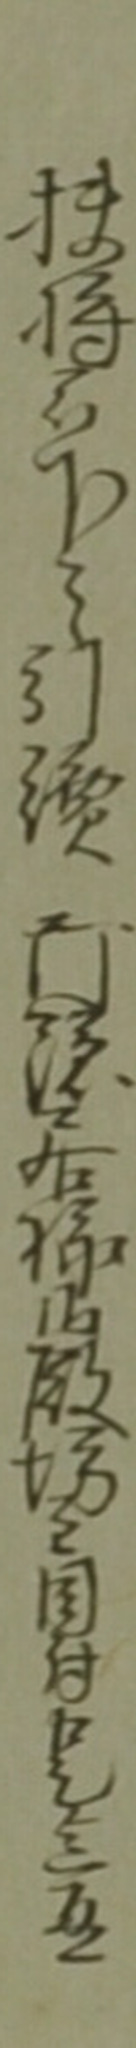扶持被下之引続御隠居様御殿坊主目付是迄通
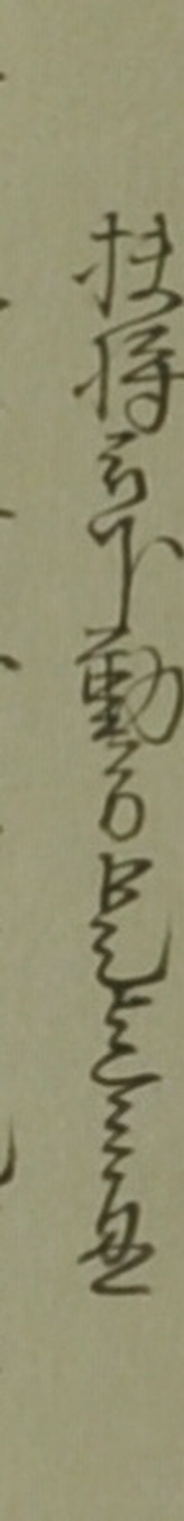扶持被下勤方是迄之通
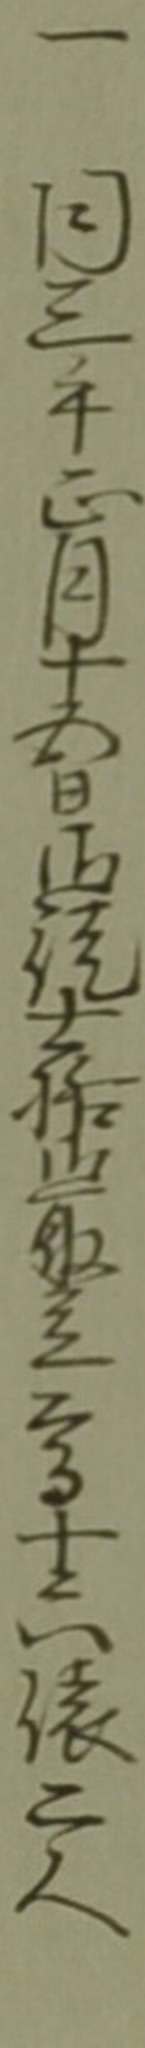一同三午正月十五日御徒士格御取立高十六俵二人
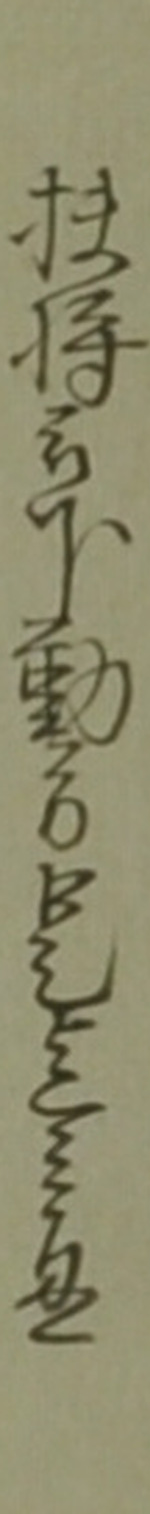扶持被下勤方是迄之通
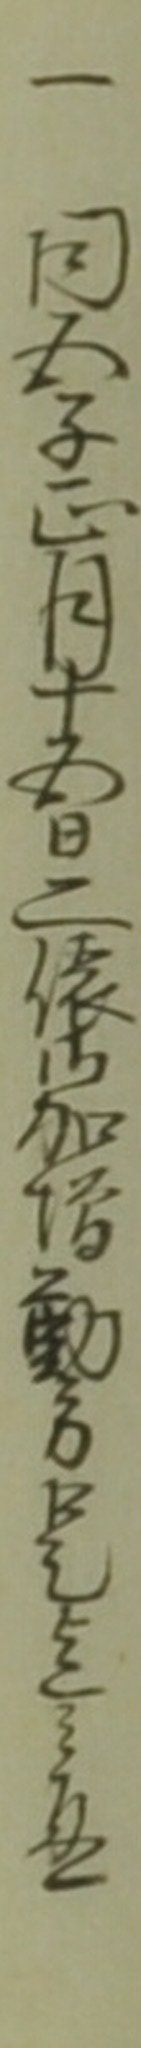一同五子正月十五日二俵御加増勤方是迄之通
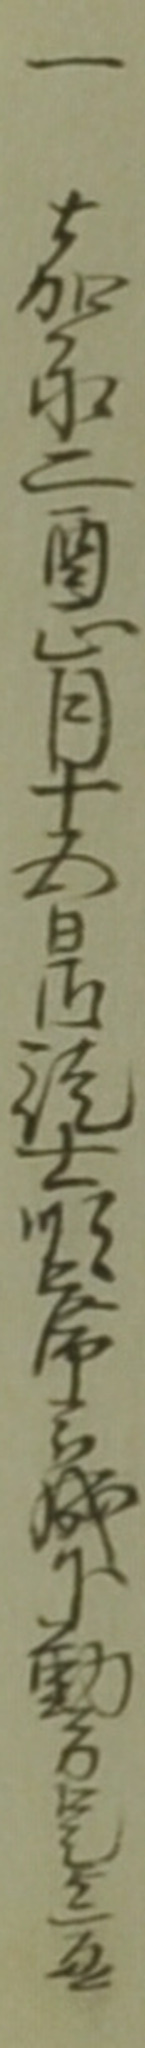一嘉永ニ酉正月十五日御徒士順席被成下勤方是迄通

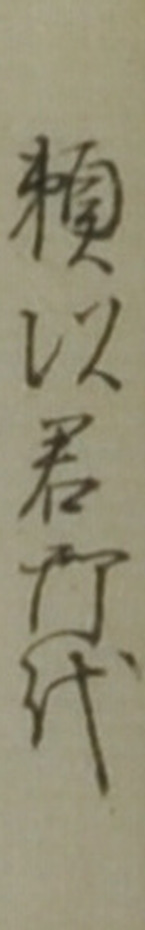頼以君御代
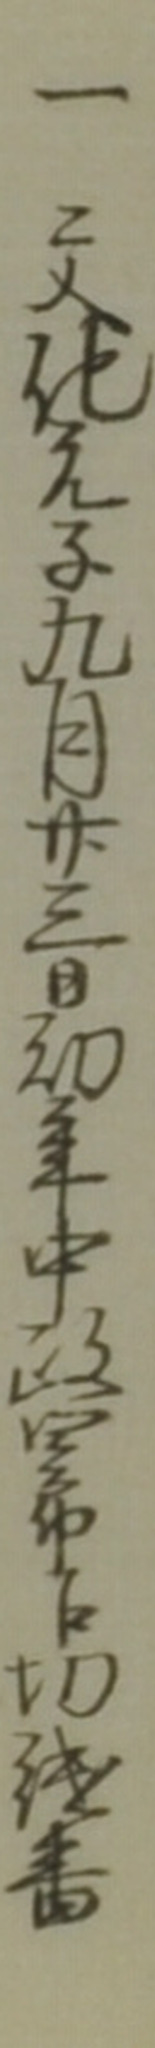一文化元子九月廿三日幼年中政四郎江切紙番
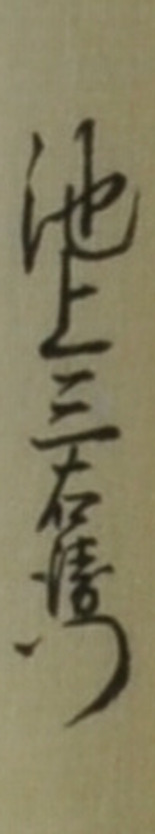池上三右衛門
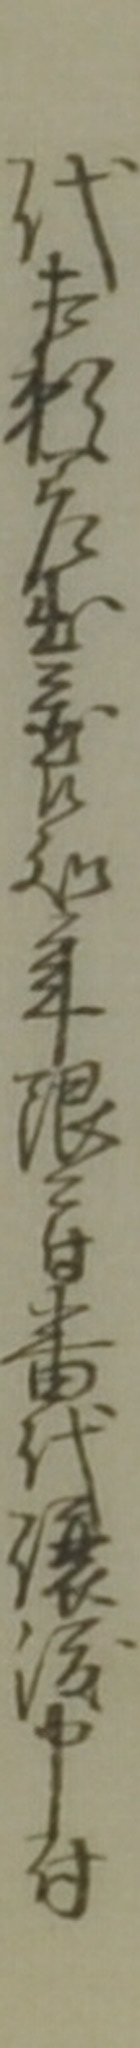代相頼差出置候処年限ニ付番代譲渡申付
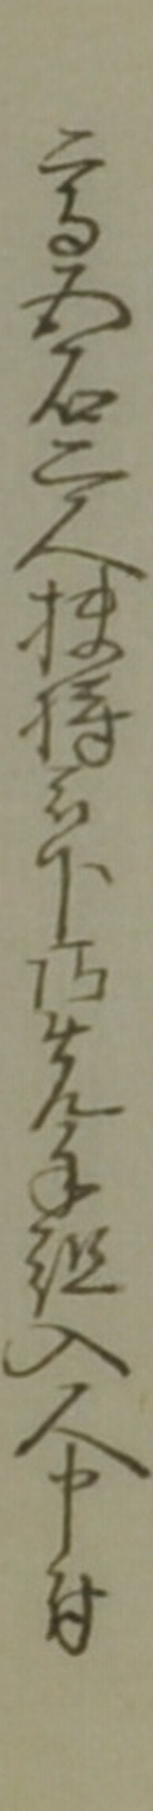高五石二人扶持被下御先手組入人申付
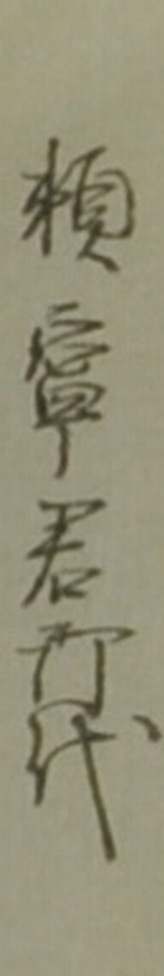頼寧君御代
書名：無足諸士勤仕録（八）
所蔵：伊那市立高遠町図書館・合同会社AMANE
